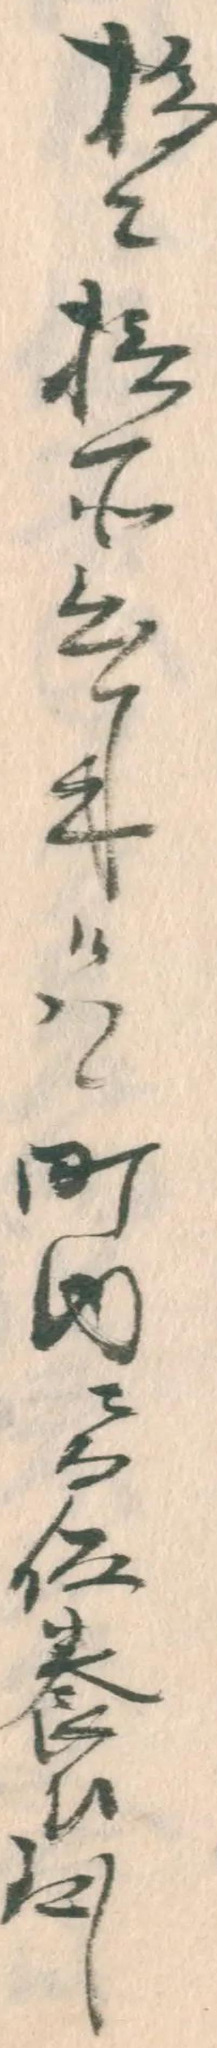橋々損所出来候ハゝ町内ニ而仮養ひ致し
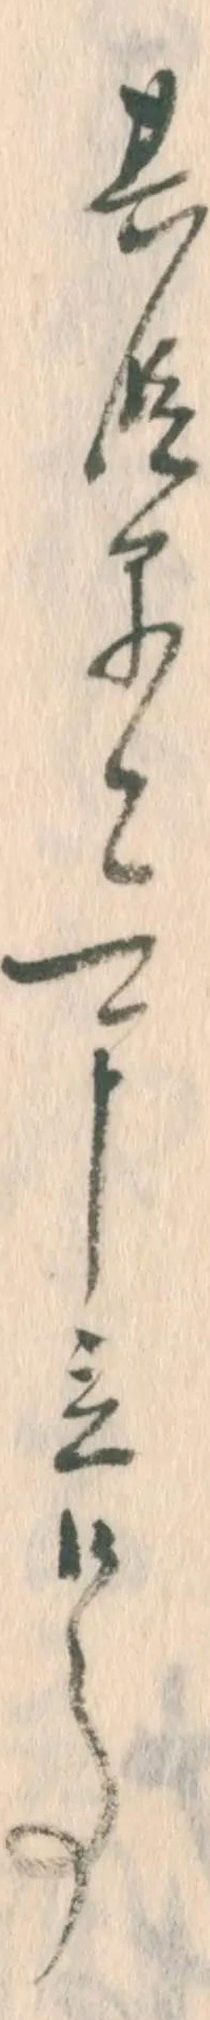其段早々可申立候事

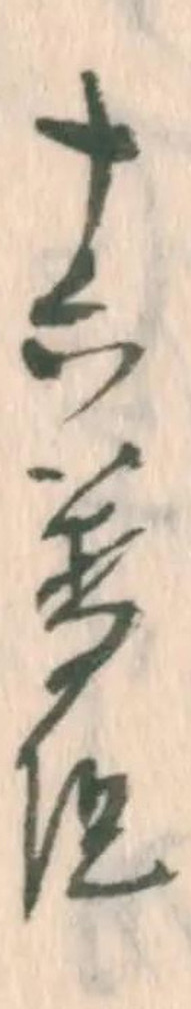十六番組
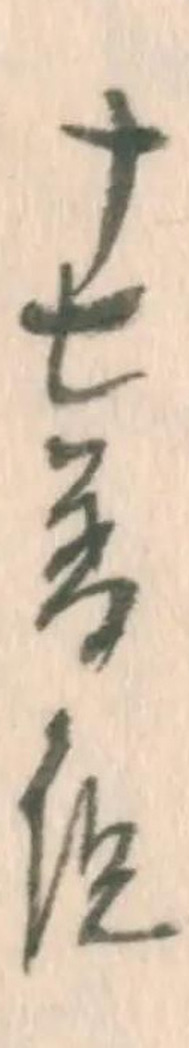十七番組
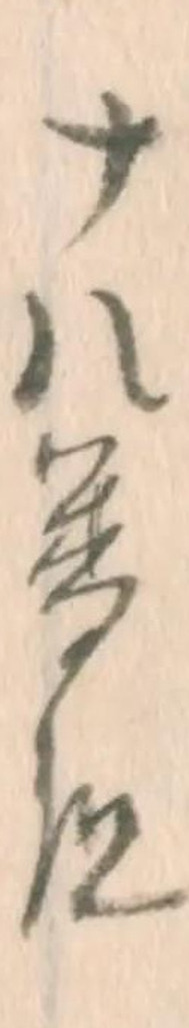十八番組
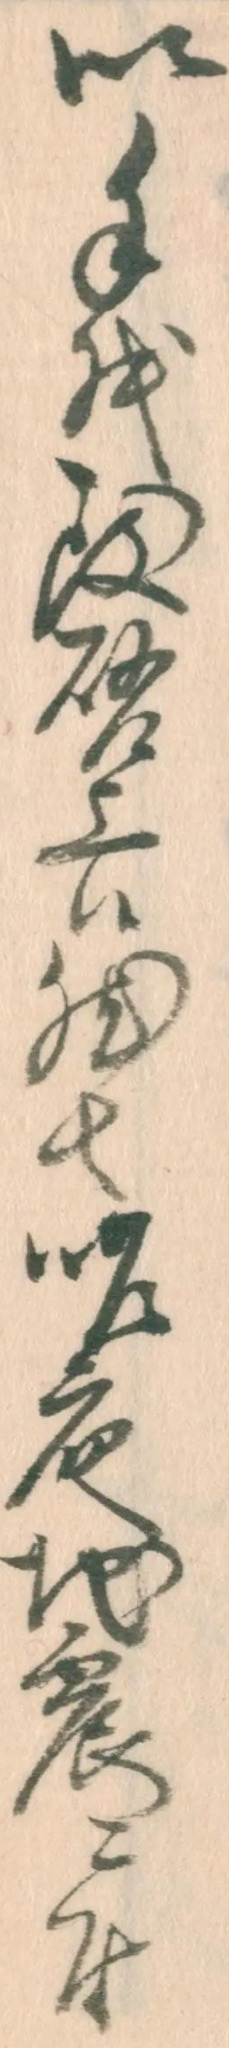以手紙致啓上候然は昨夜地震ニ付
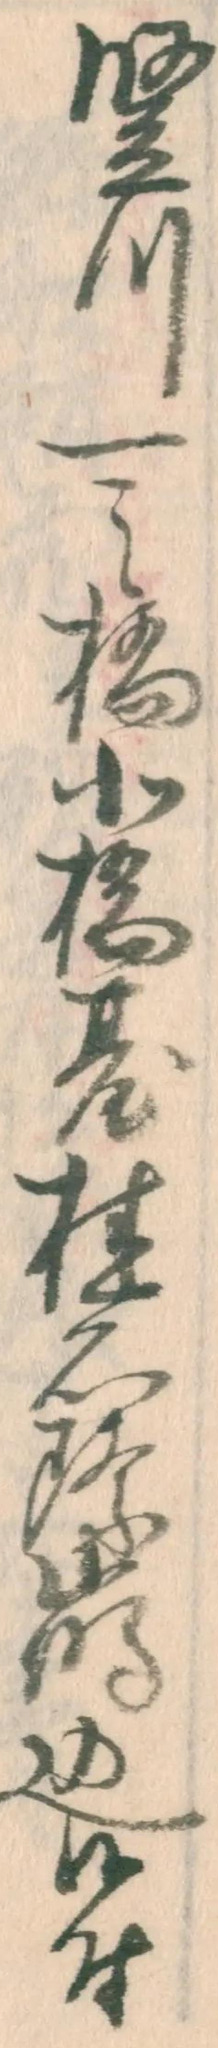竪川一之橋北橋台柱石際崩込候付
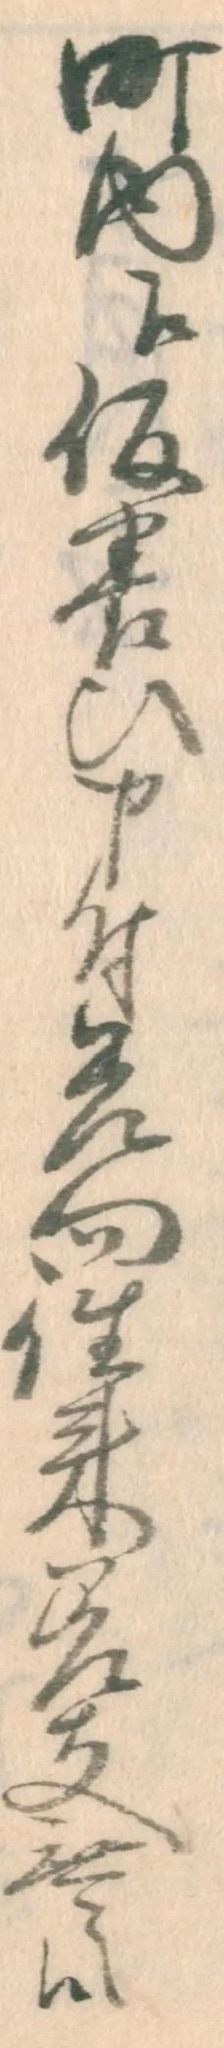町内え仮養ひ申付差向往来差支無之候
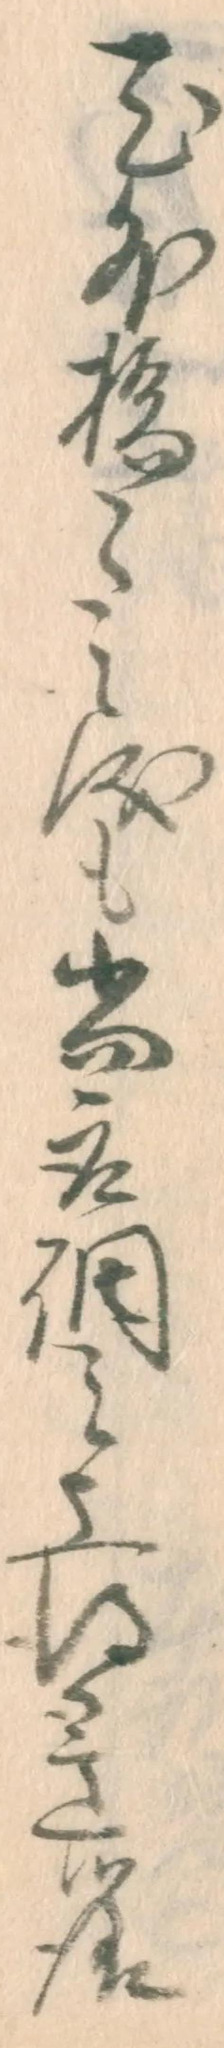尤外橋々之儀も尚取調之上得御意候様

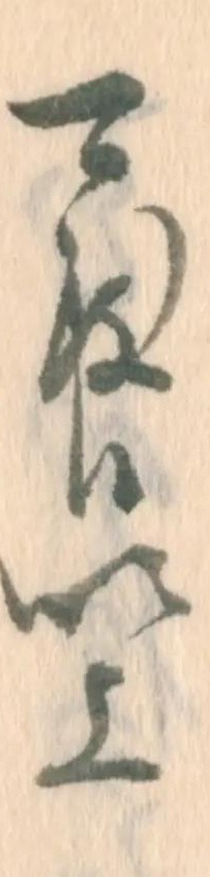可致候以上
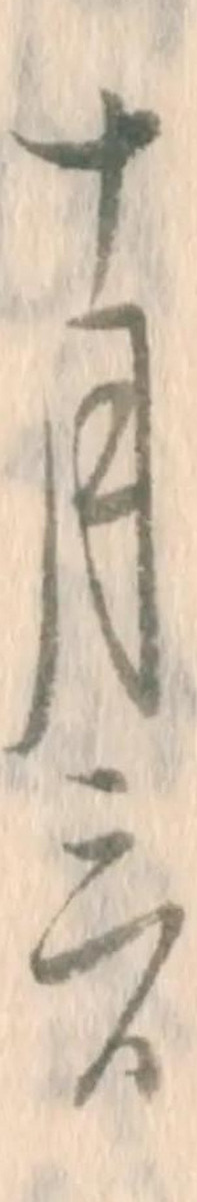十月三日
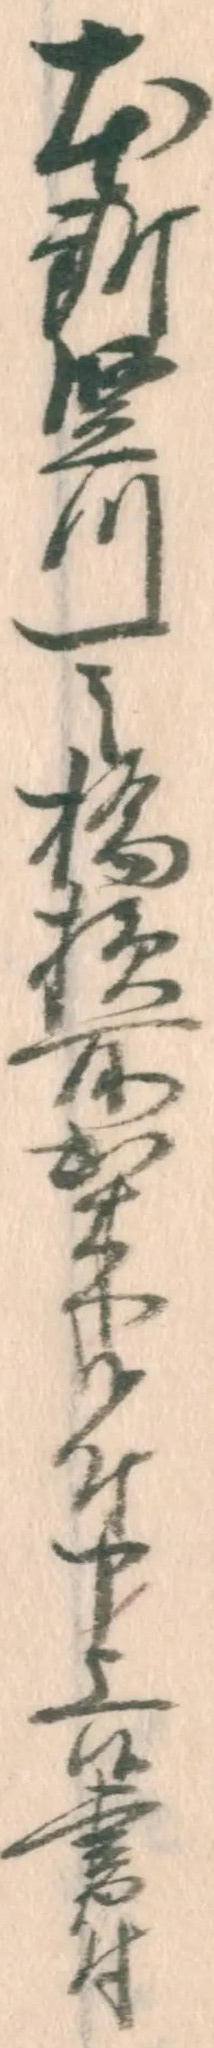│本所竪川一之橋損所出来候付申上候書付
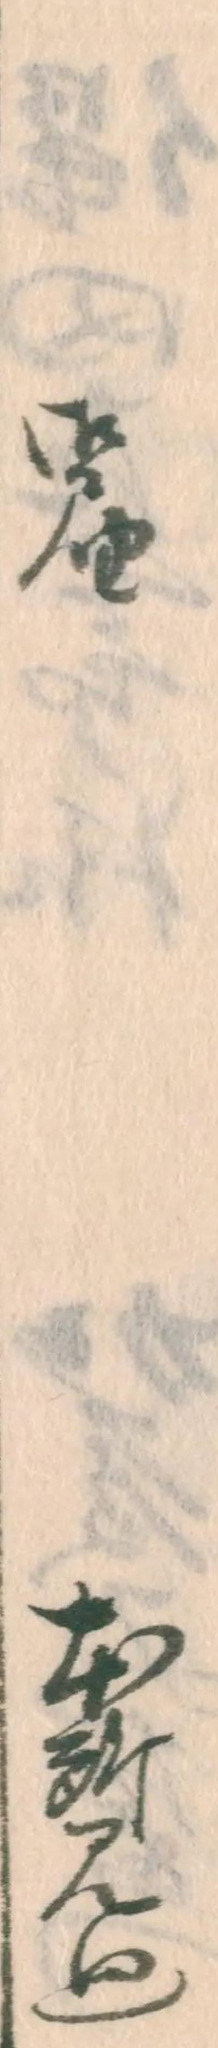│御届本所見廻
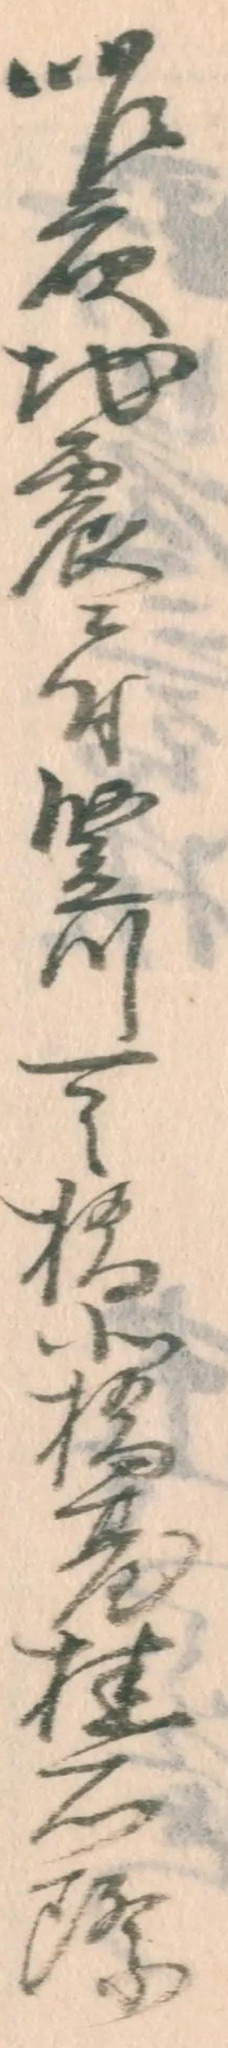昨夜地震ニ付竪川一之橋北橋台柱石際
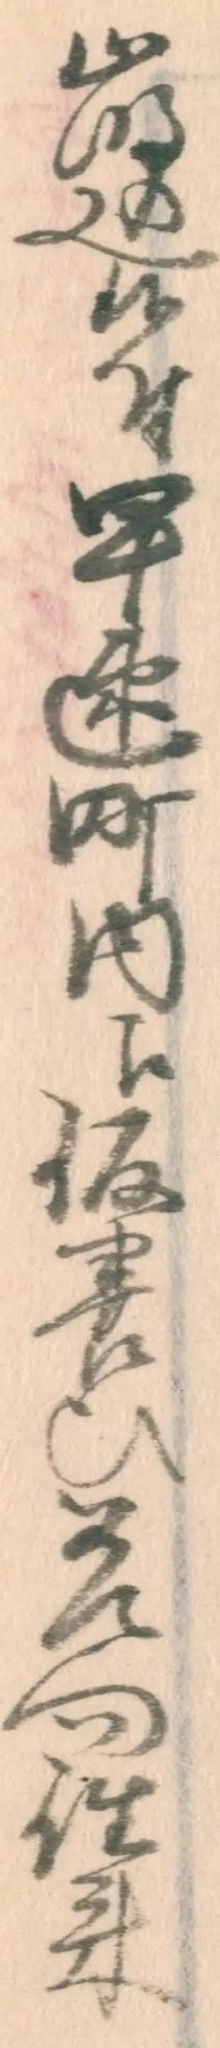崩込候付早速町内え仮養ひ差向往来
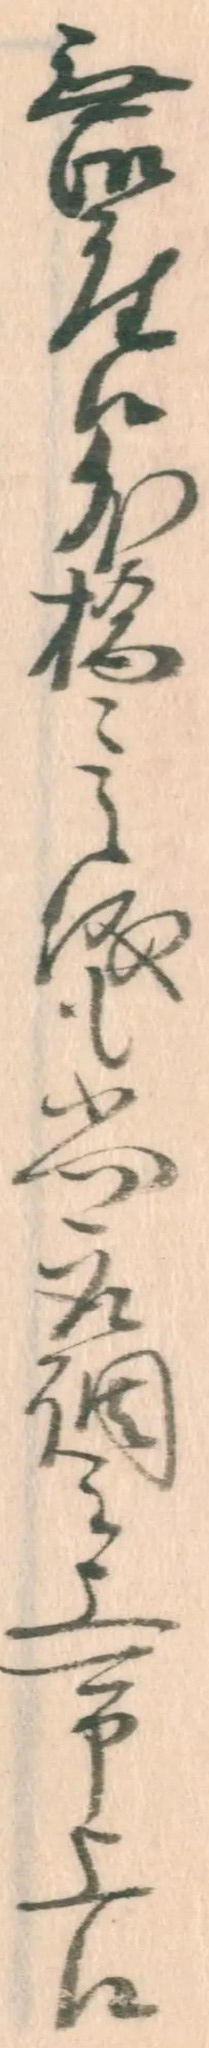無御座候外橋々之儀も尚取調之上可申上候
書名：地震災書留 2巻. [1] 内表紙に「地震災書留　安政二卯年　但本所深川御用屋敷地代免除調」とあり
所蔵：国立国会図書館 National Diet Library, JAPAN
